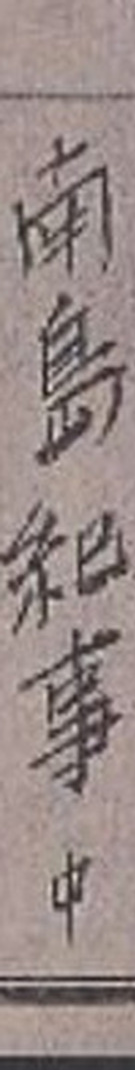南島紀事中
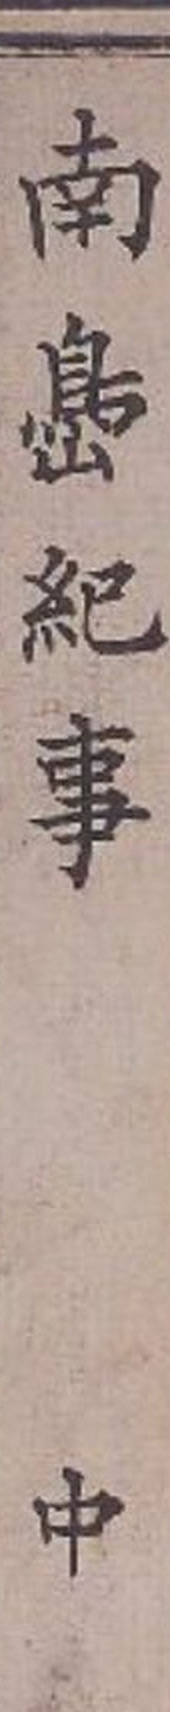南島紀事中

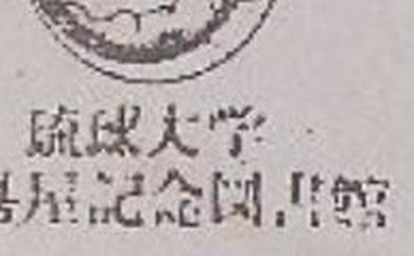琉球大学
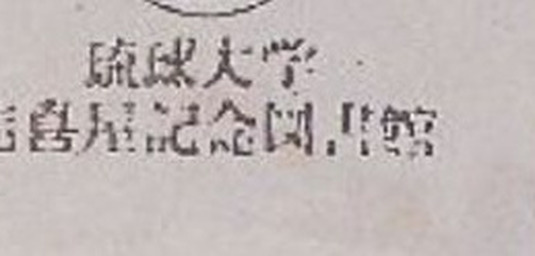志喜屋記念図書館
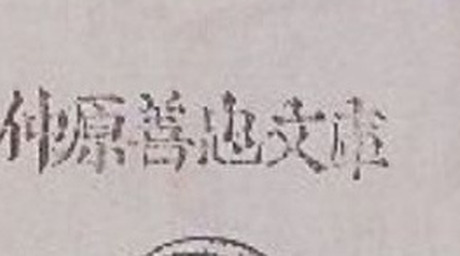仲原善忠文庫
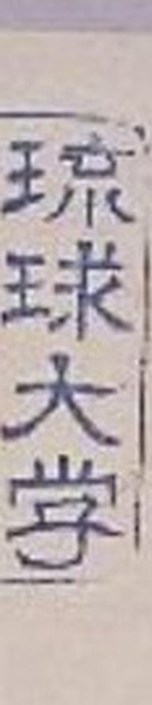琉球大学

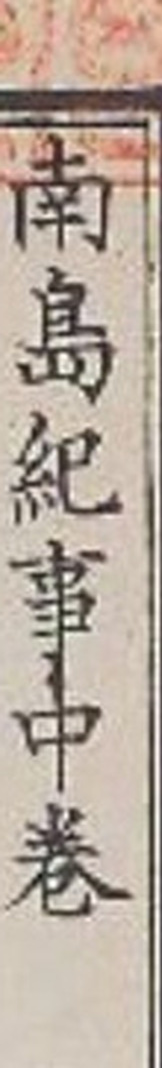南島紀事中巻
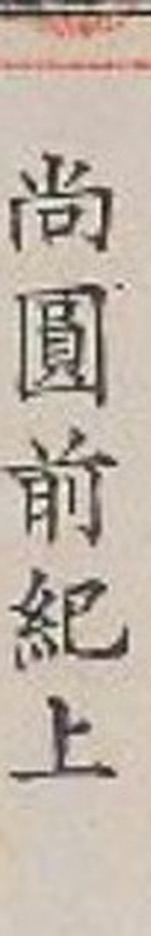尚円前紀上
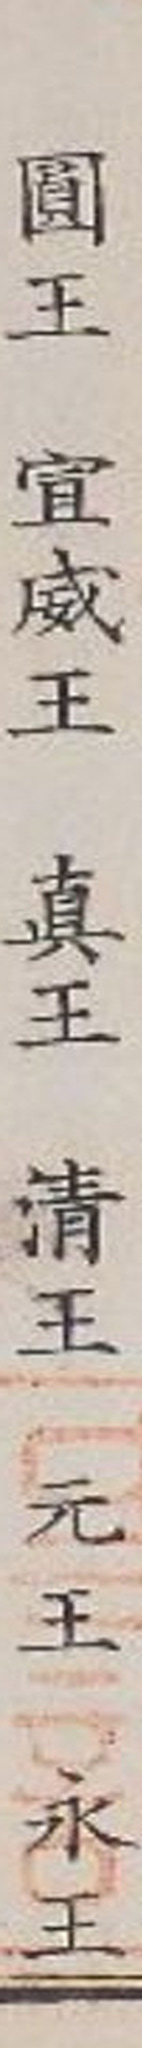円王宣威王真王清王元王永王
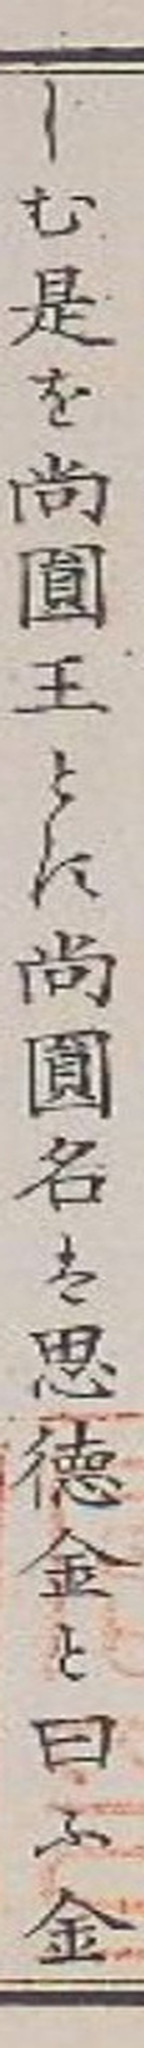しむ是を尚円王とす尚円名は思徳金と曰ふ金
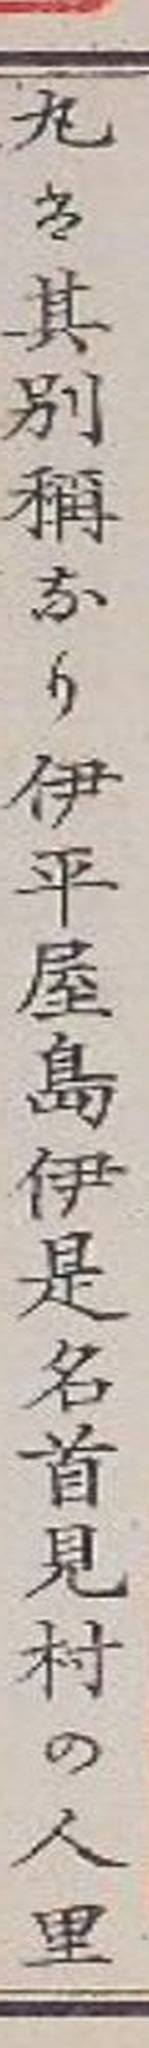丸は其別称なり伊平屋島伊是名首見村の人里

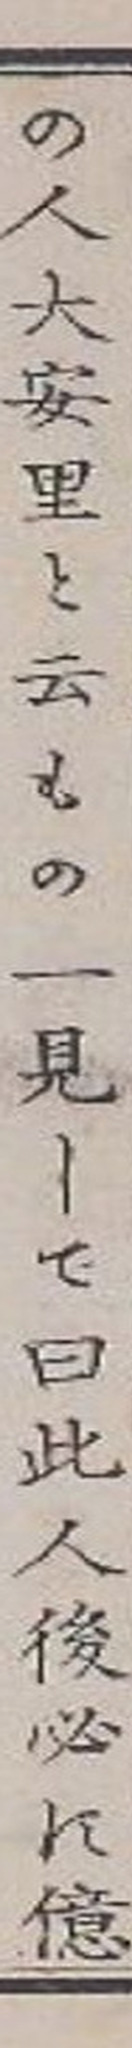の人大安里と云もの一見して曰此人後必す億
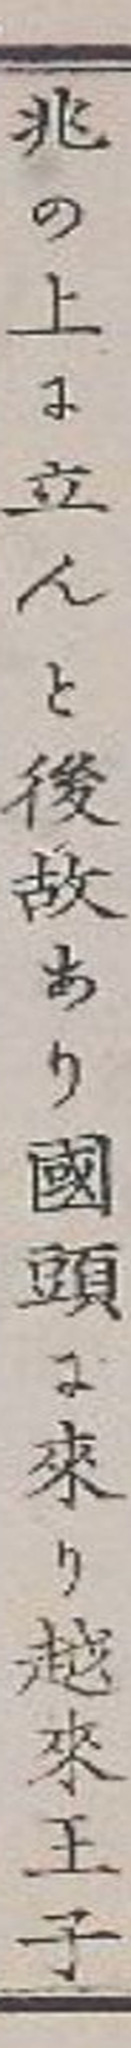兆の上に立んと後故あり国頭に来り越来王子
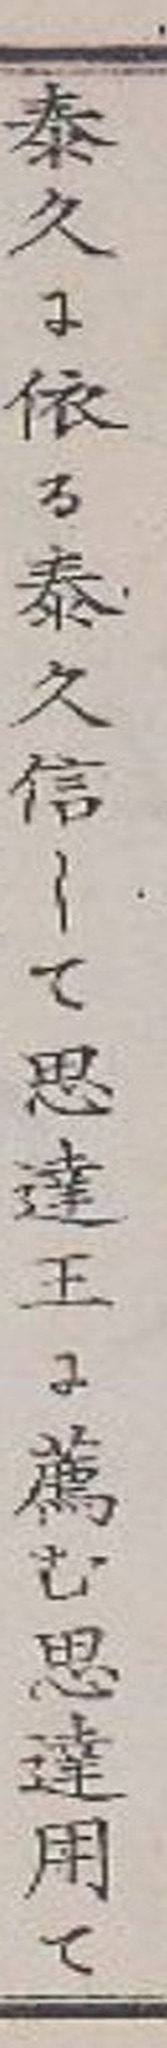泰久に依る泰久信して思達王に薦む思達用て
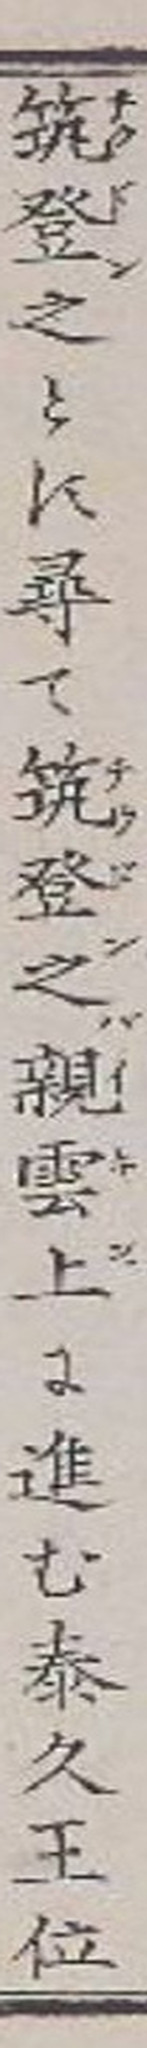筑登之とす尋て筑登之親雲上に進む泰久王位
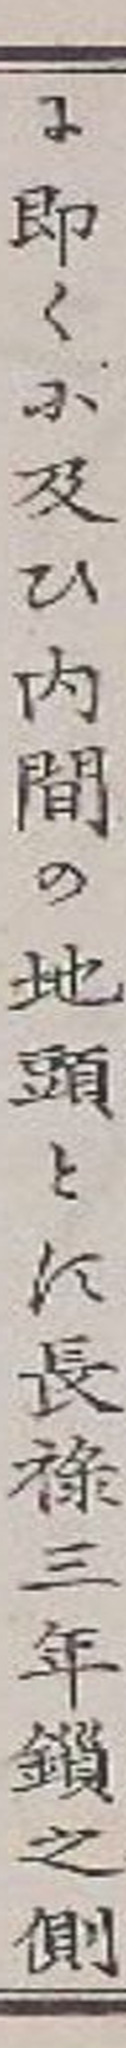に即くに及ひ内間の地頭とに長禄三年鎖之側
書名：南島紀事 中
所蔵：University of the Ryukyus Library
